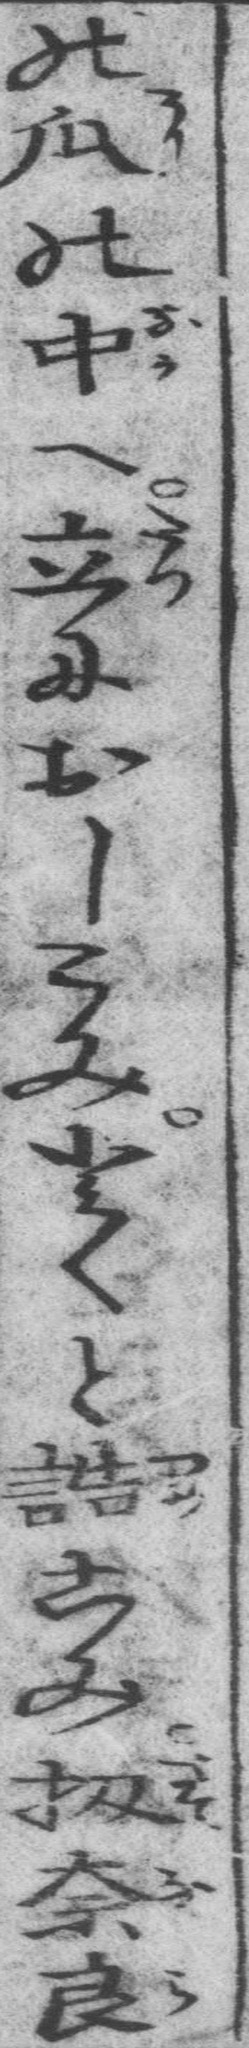の瓜の中へ。立におしこみ。とくと詰こみ。扨奈良

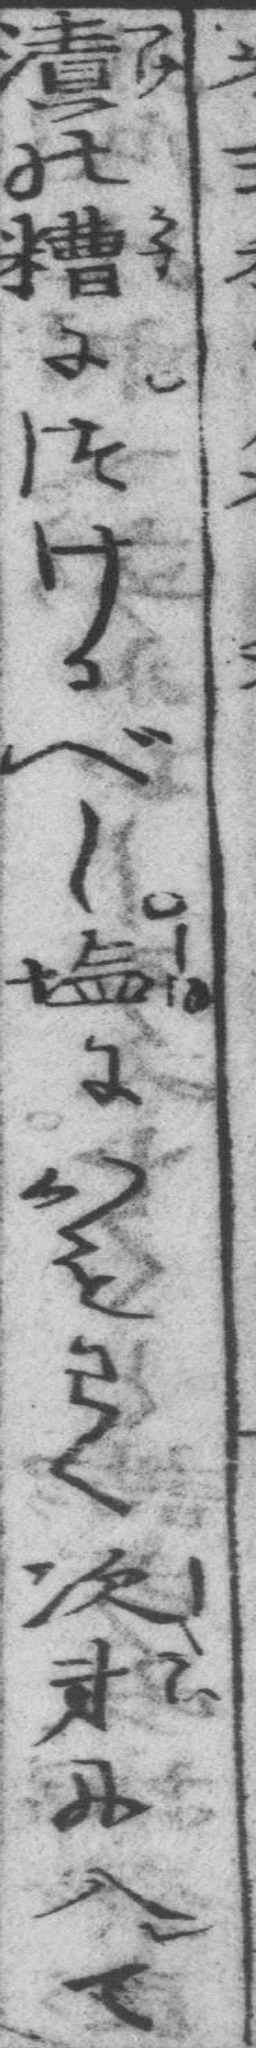漬の糟に。つけるべし。塩におもわく次第に入れて
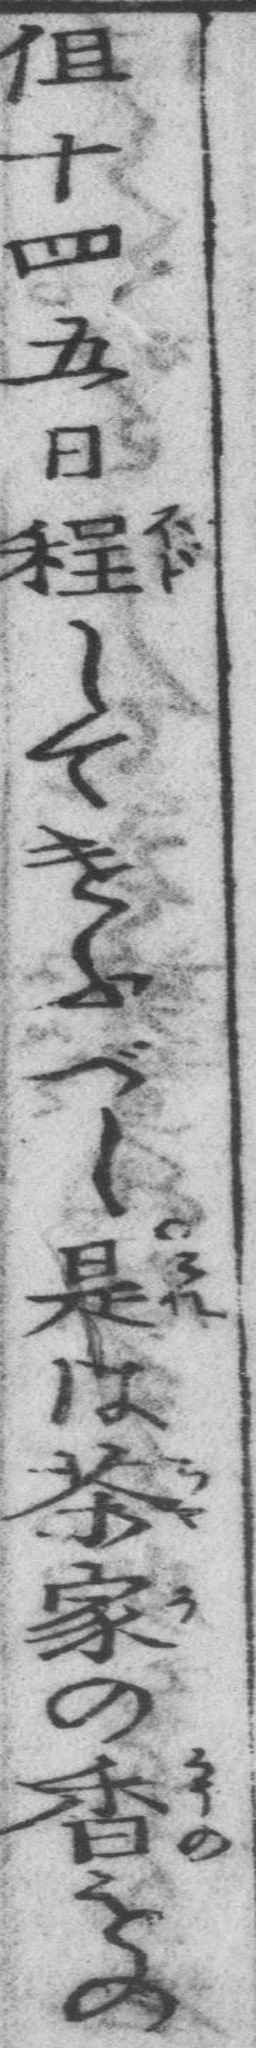但十四五日程して遣ふべし。是は茶家の香もの
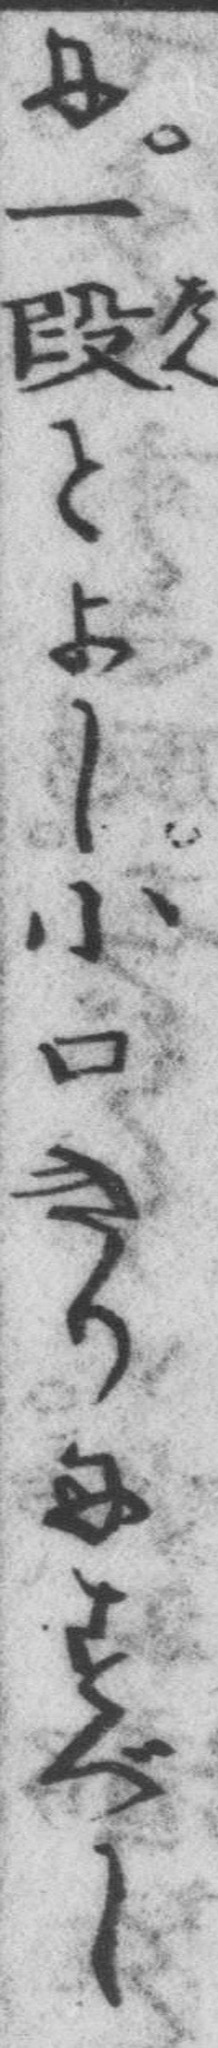に。一段とより。小口きりにすべし
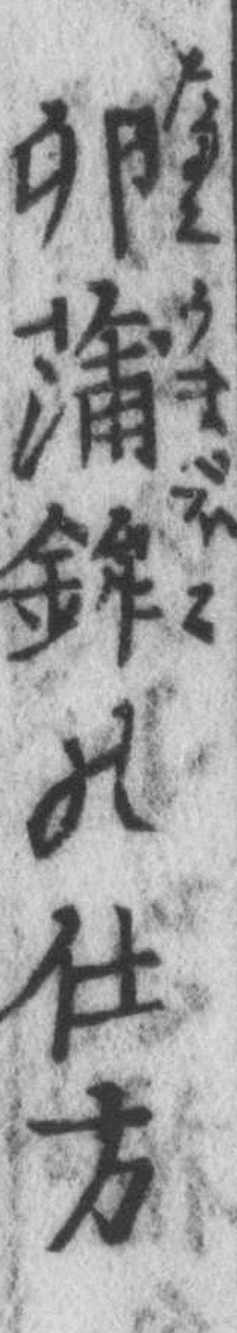卵蒲鉾の仕方
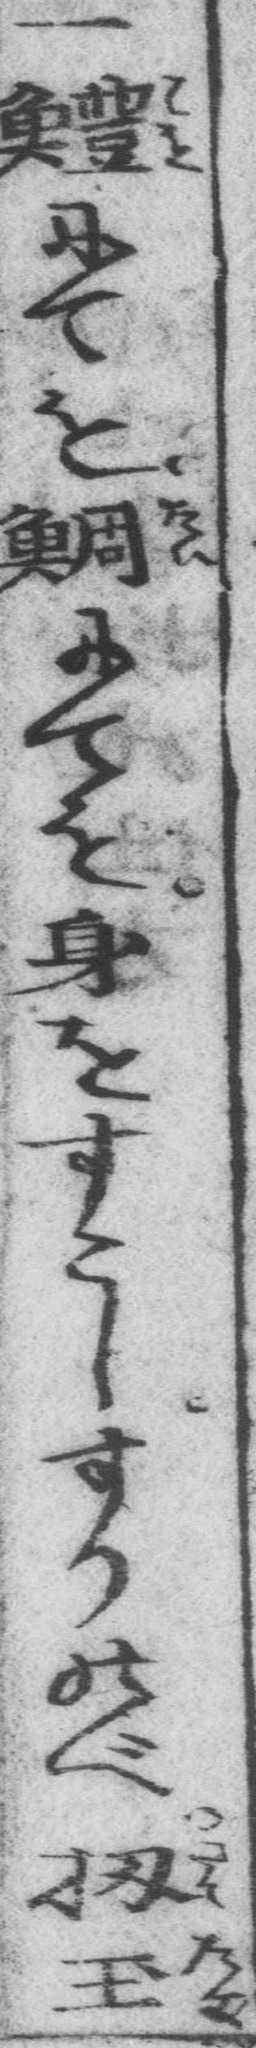一鱧にても。鯛にても。身をすこし。すりのべ。扨玉
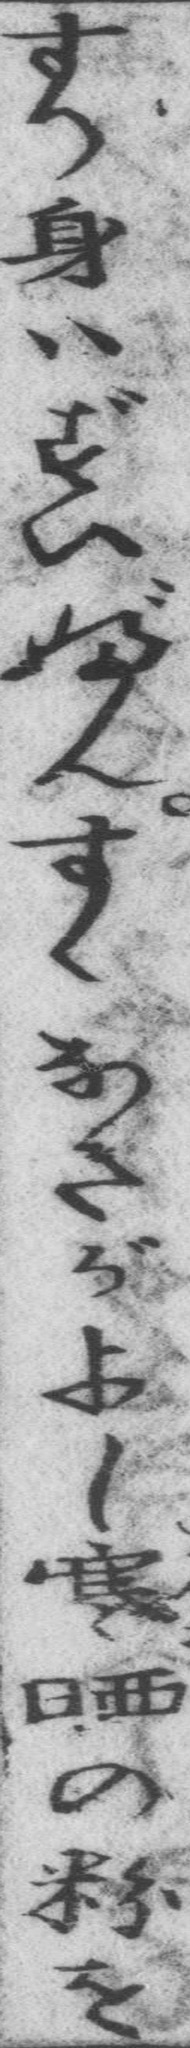すり身はずいぶん。すくなきがよし。寒晒の粉を
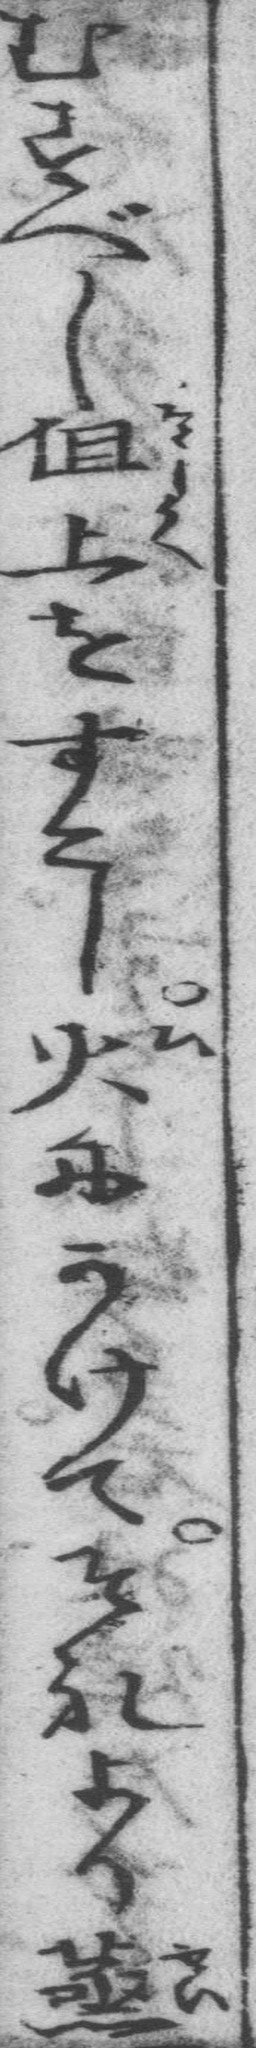むすべし但上をすこし。火にかけて。それより蒸
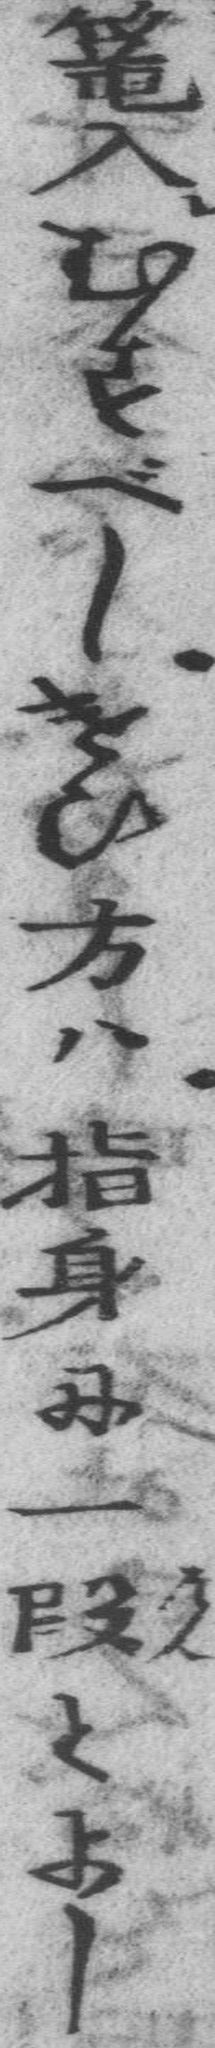篭入れむすべし。遣ひ方は。指身に一段とよし
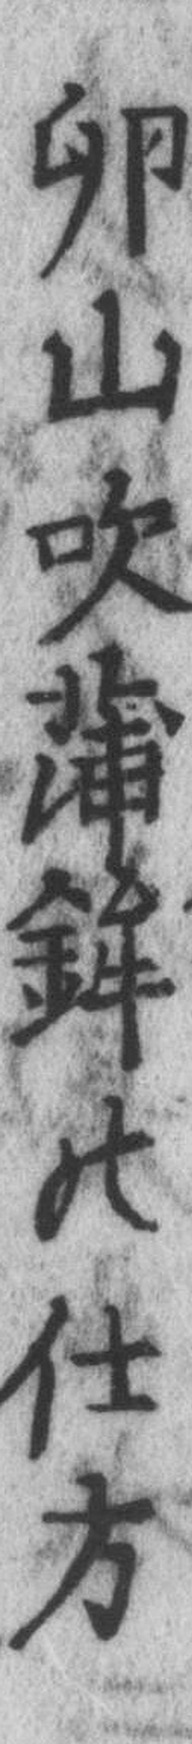卵山吹蒲鉾の仕方
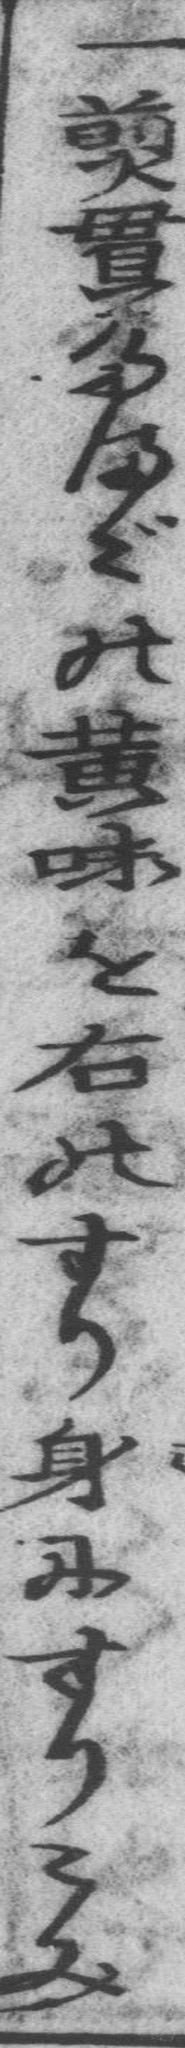一煎貫たまごの。黄味を。右のすり身にすりこみ
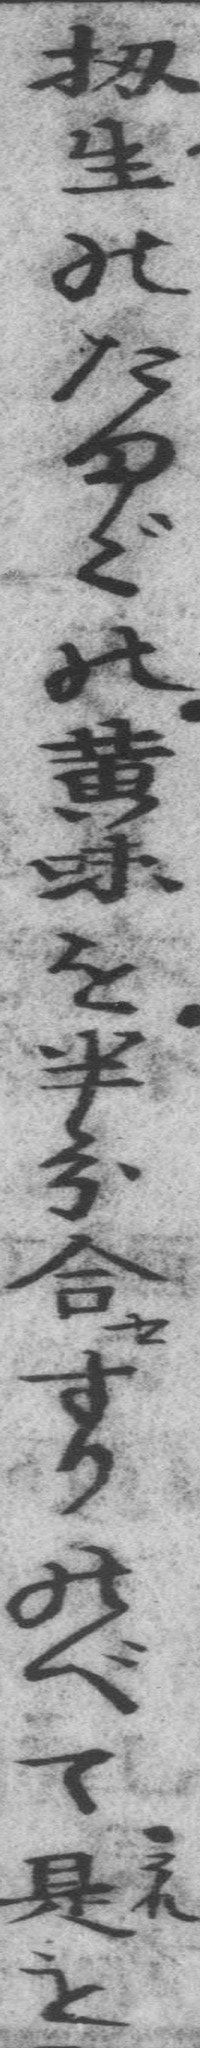扨生のたまごの。黄味も。半分合せすりのべて。是も
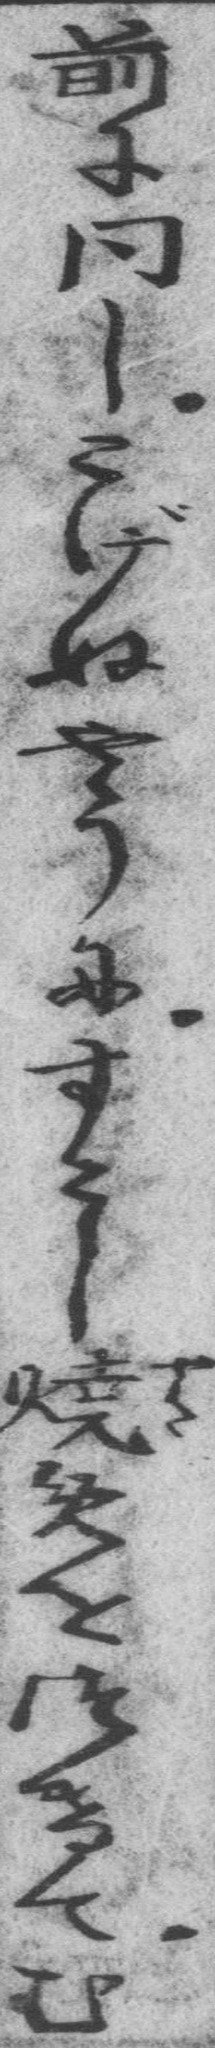前に同し。こげぬやうに。すこし焼めをつけて。む
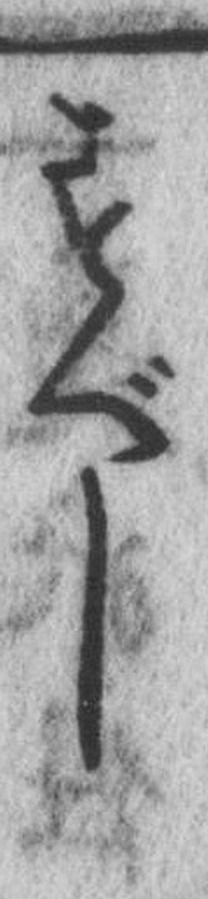すべし
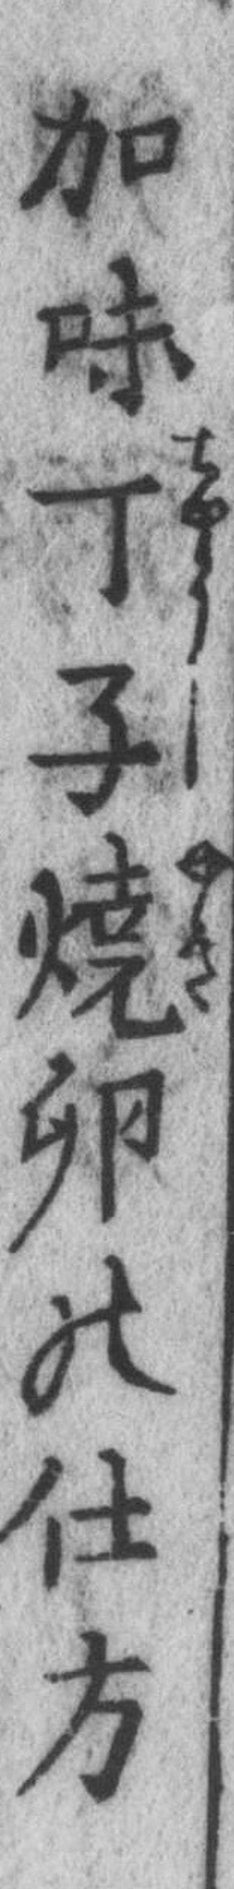加味丁子焼卵の仕方
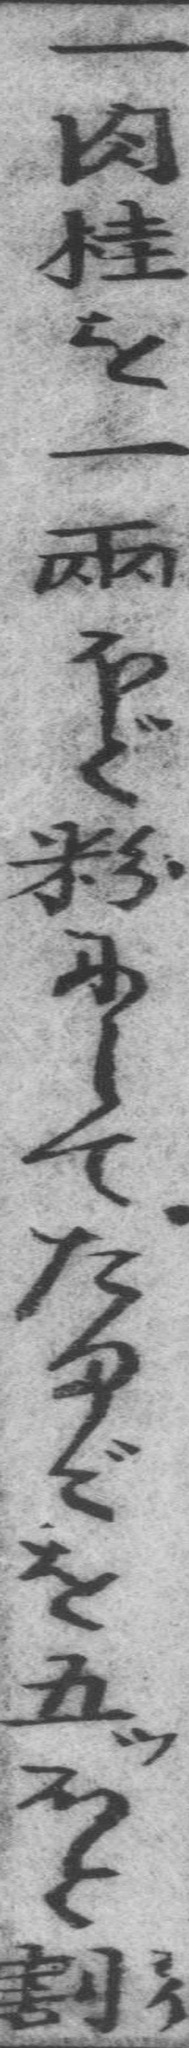一肉桂を一両ほど。粉にして。たまごを五ツほと割
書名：萬寳料理秘密箱
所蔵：大阪府立大学学術情報センター 国文学研究資料館
